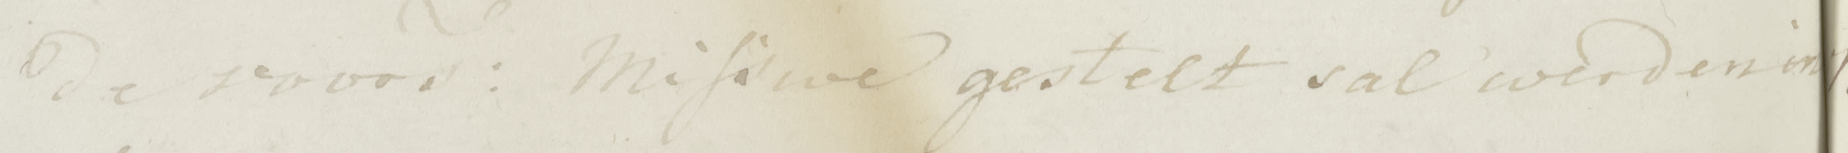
de voors: Missive gestelt sal werden in
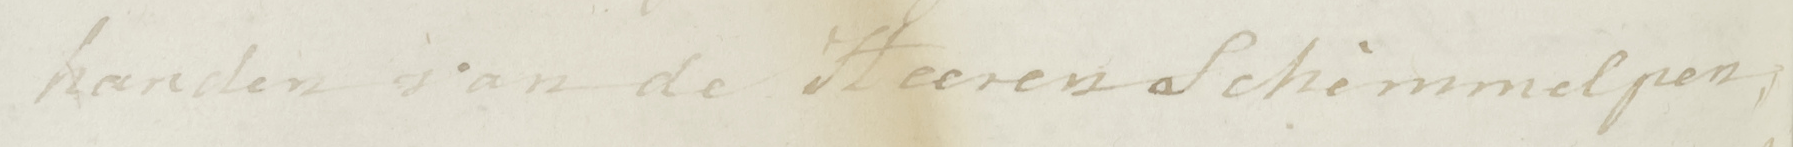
handen van de Heeren Schimmelpen„
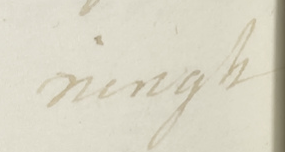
ningh
